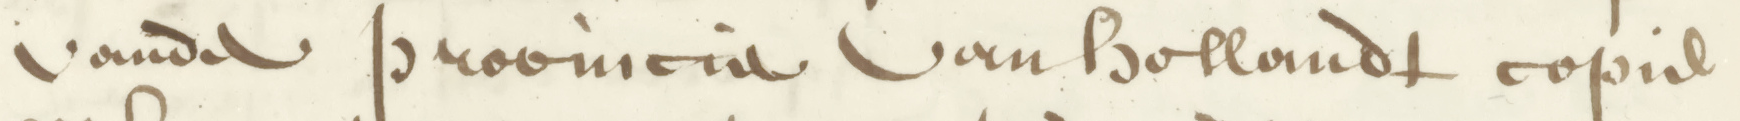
vande provincie van Hollandt copie„
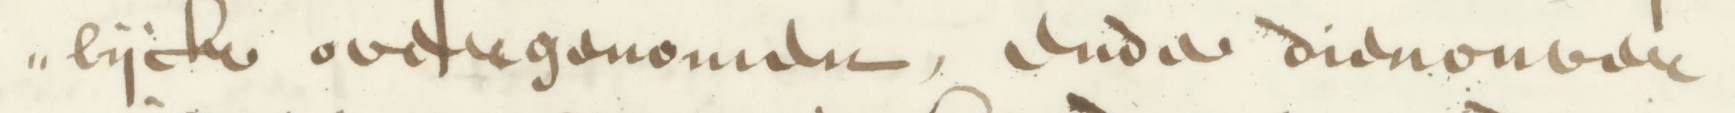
,,lijck overgenomen ende dienonver„
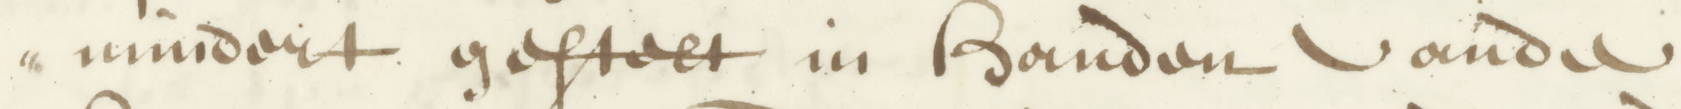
,,mindert gestelt in handen vande
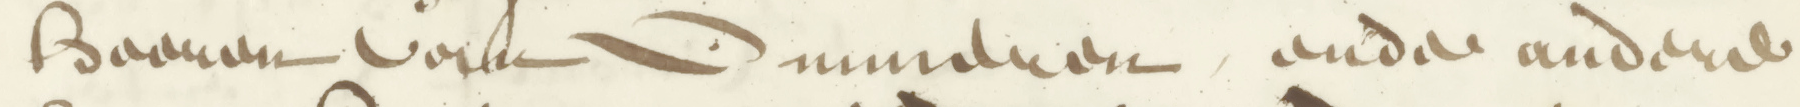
heeren van Ommeren, ende andere
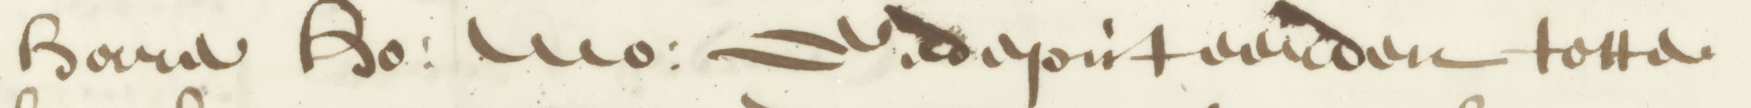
hare Ho: Mo: Gedeputeerden totte
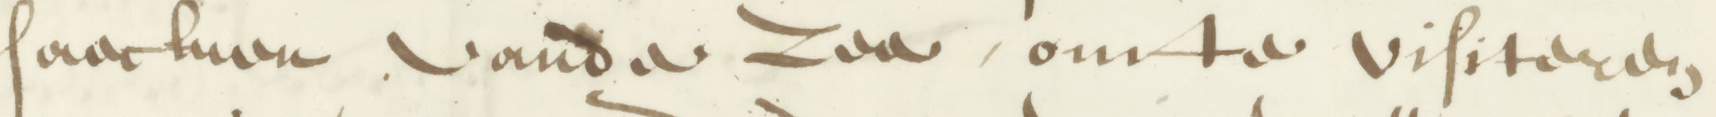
saecken vande Zee, om te visiteren
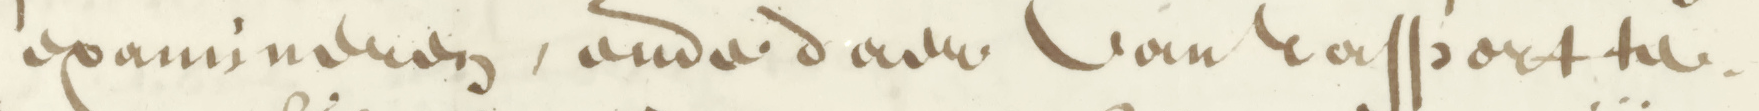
examineren, ende daer van rapport te
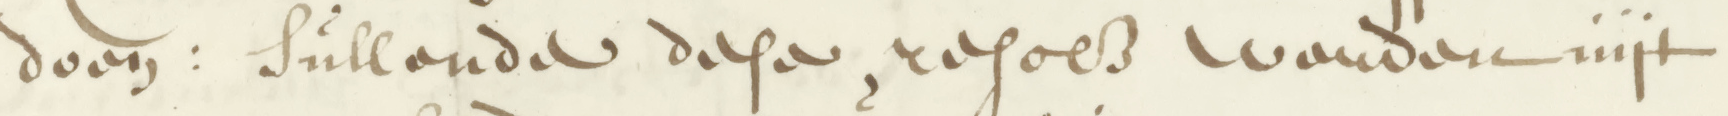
doen: Sullende dese resols. worden uijt
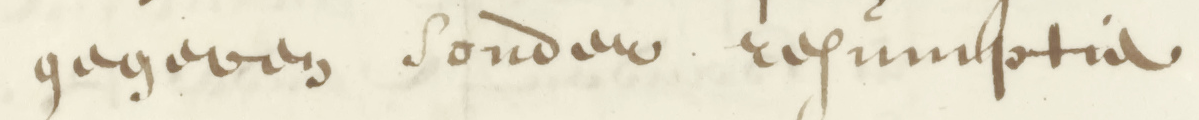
gegeven sonder resumptie.
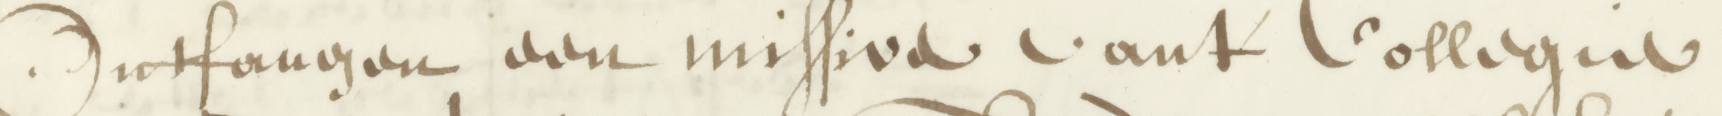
Ontfangen een missive vant Collegie
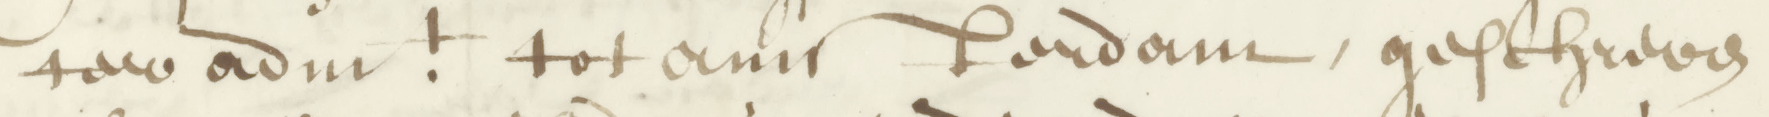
ter Admt tot Amsterdam, geschreven
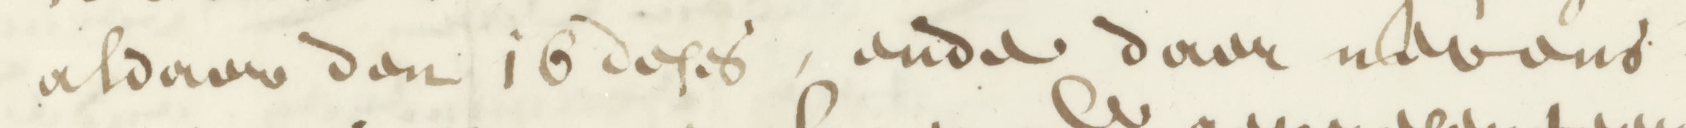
aldaer den 16 deses, ende daer nevens
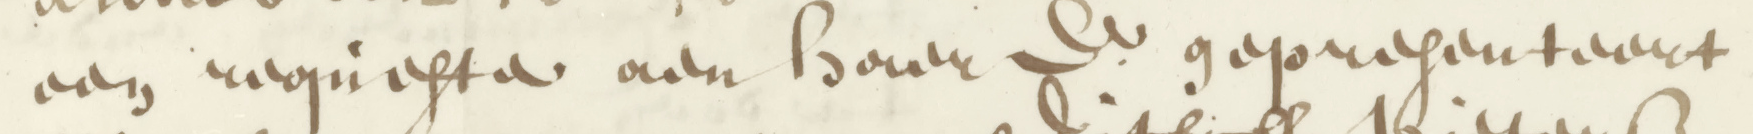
een requeste aen haer E. gepresenteert
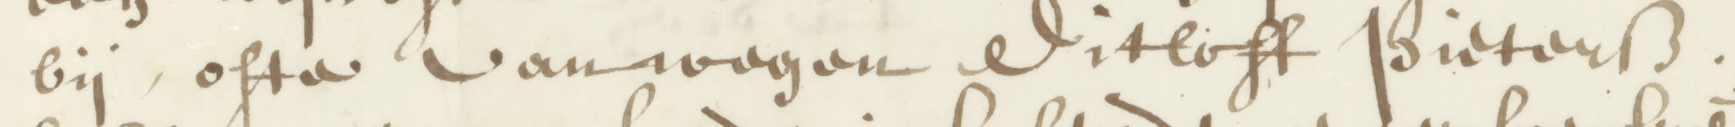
bij, ofte van wegen Ditleff Pieterss.
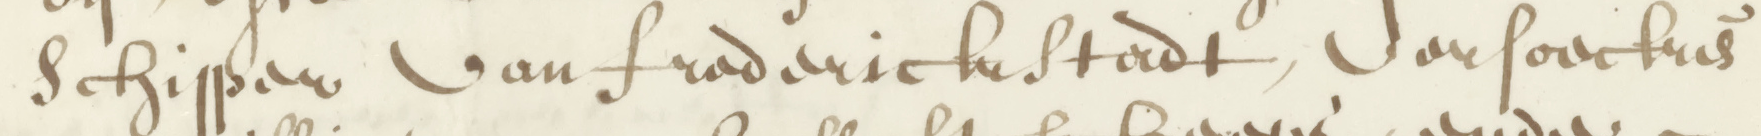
schipper van Frederickstadt, versoecken
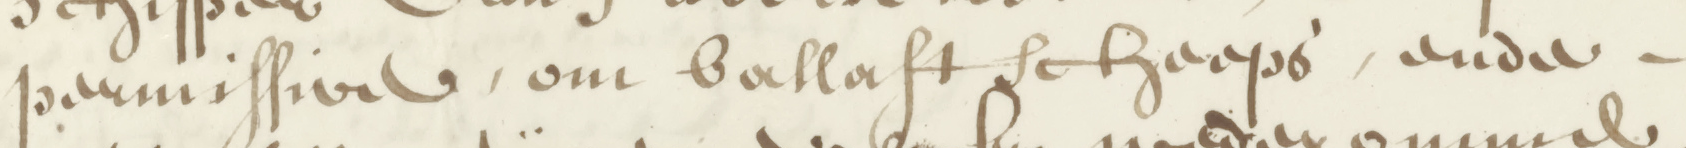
permissive, om ballast scheeps, ende
